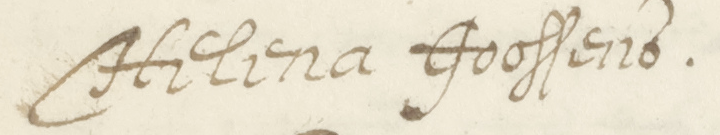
Helena Goossens.
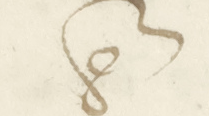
ca
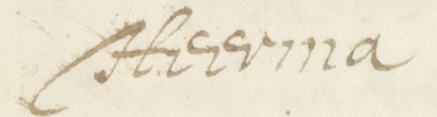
Heerma
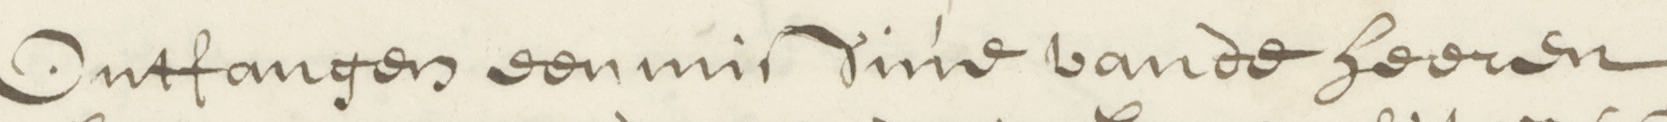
Ontfangen een missiue vande heeren
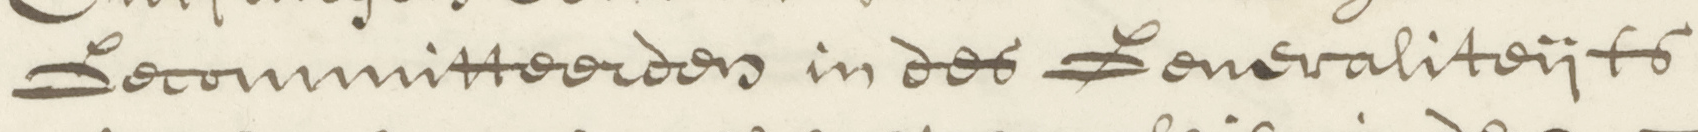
Gecommitteerden in des Generaliteijts
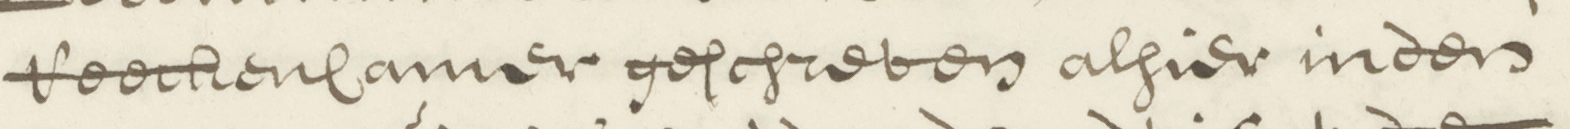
ReeckenCamer geschreven alhier inden
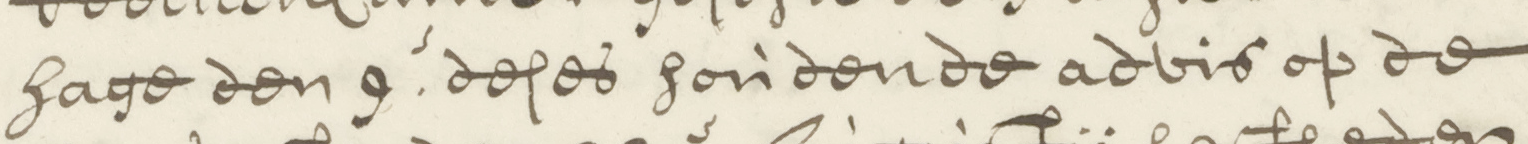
hage den 9e. deses houdende advis op de
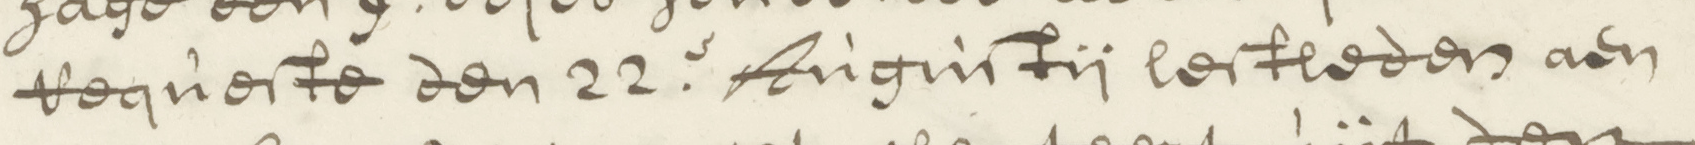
Requeste den 22e. Augustij lestleden aen
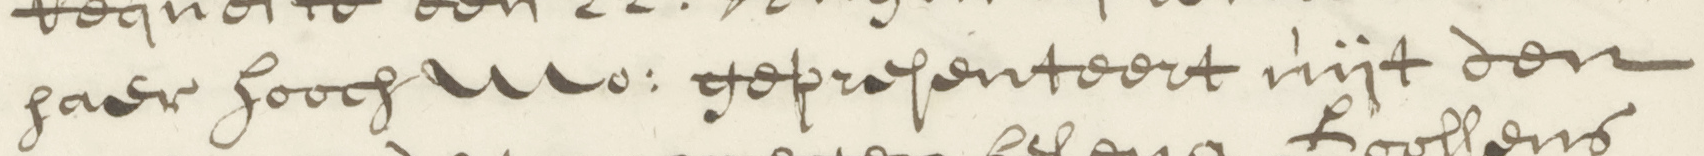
haer hooch Mo: gepresenteert uijt den
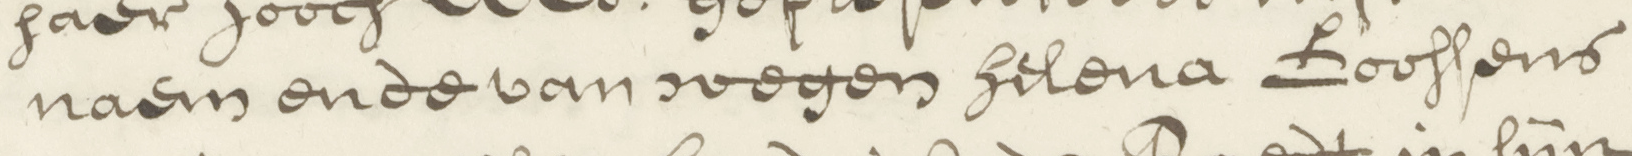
naem ende van wegen helena Goossens
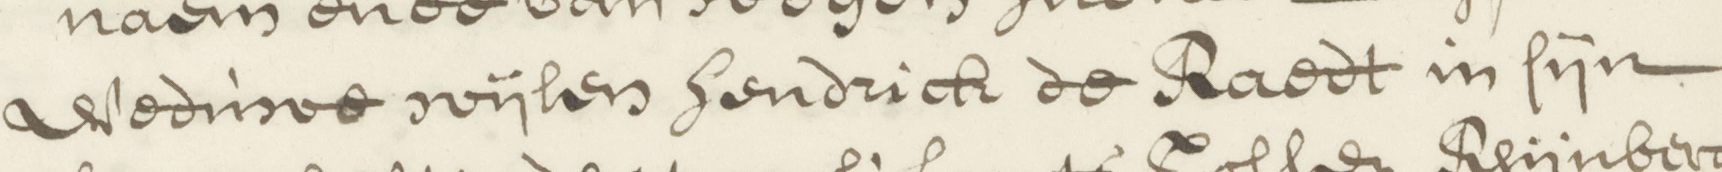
Weduwe wijlen hendrik de Raedt in sijn
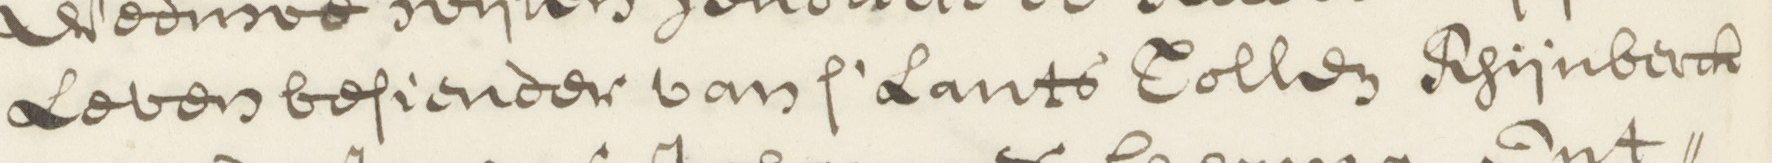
Leven besiender van s‛Lants Tollen Rhijnberck
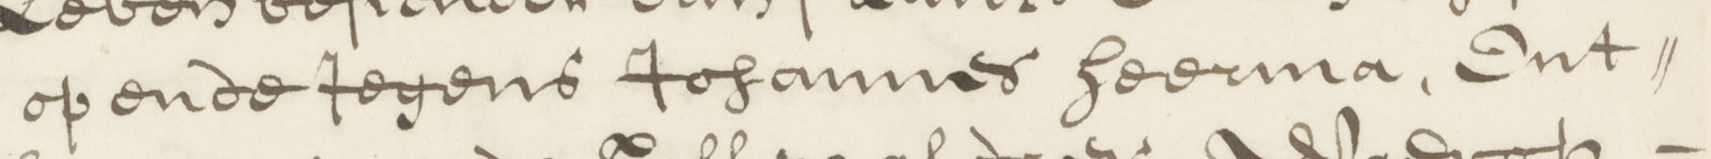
op ende Jegens Johannes Heerma, Ont„
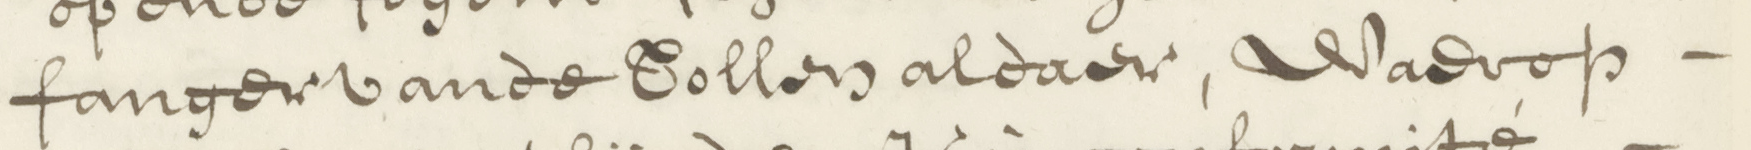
fanger vande Tollen aldaer, Waerop -
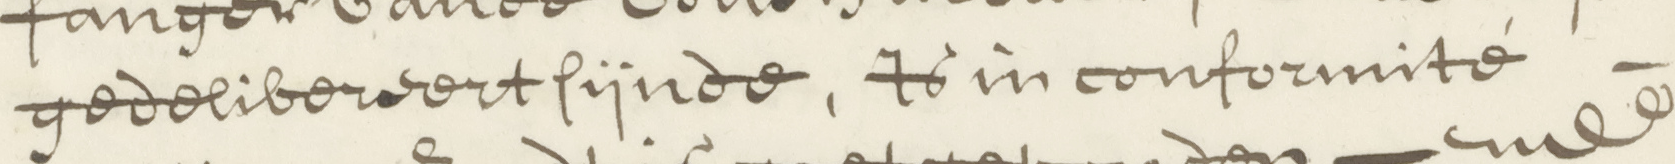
gedelibereert sijnde, Is in conformité -
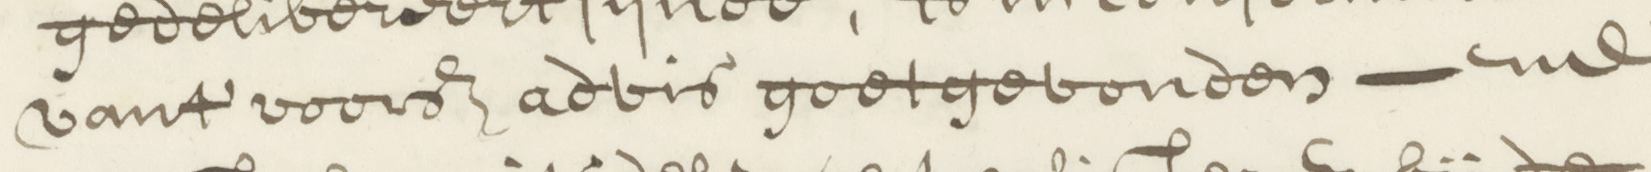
vant voors advis goetgevonden ende
